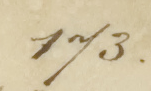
173.
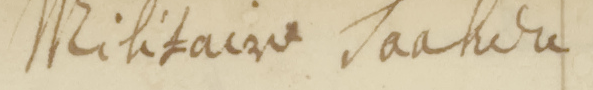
Militaire Saaken
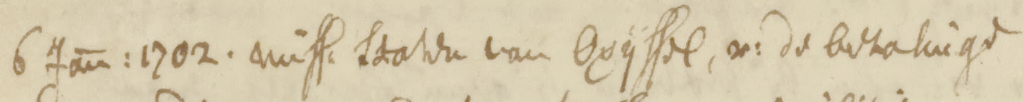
6 Jan: 1702 miss: Staten van Ovijssel, r: de betalinge
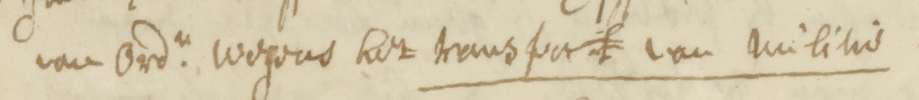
van Orde. wegens het transport van Militie.
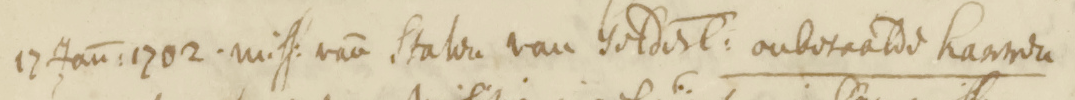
17 Jan: 1702 miss: van Staten van Gelderl: onbetaalde karren
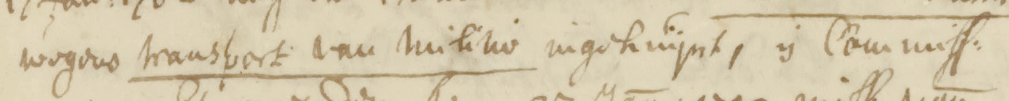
wegens transport van Militie ingehuijrt, is Commiss:
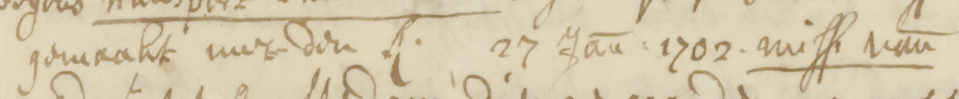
gemaakt met den R. 27 Jan: 1702 miss: van
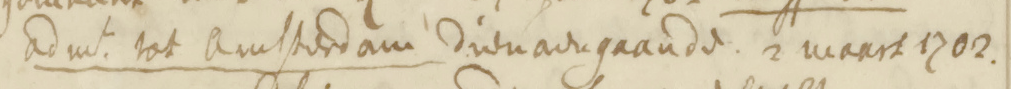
Admt. tot Amsterdam dienaengaande, 2 maart 1702.
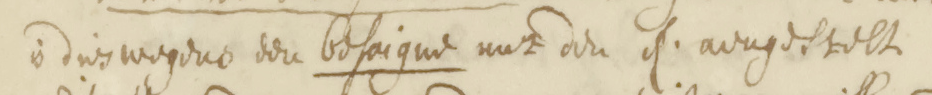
is dieswegens den besoigne met den R. aengestelt
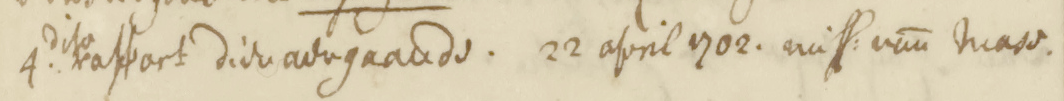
4.dito Rapport dienaengaande. 22apal 1702. miss: van Mase
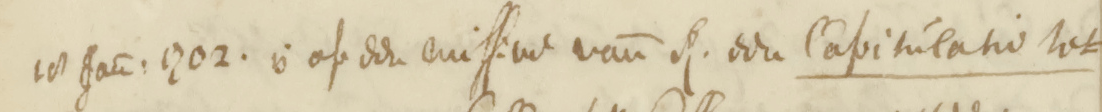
18 Jan: 1702. is op een missive van R. een Capitulatie tot
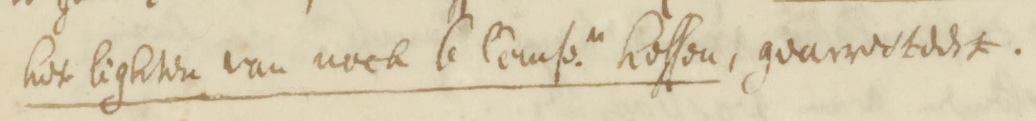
het lighten van noch 6 Compn. hessen, gearresteert.
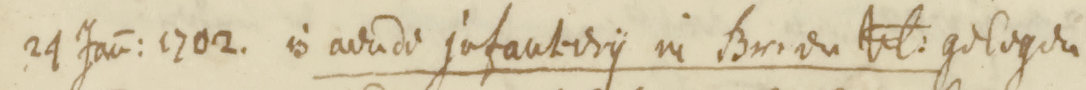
24 Jan: 1702. is aende infanterij in Br. en VL: gelegen
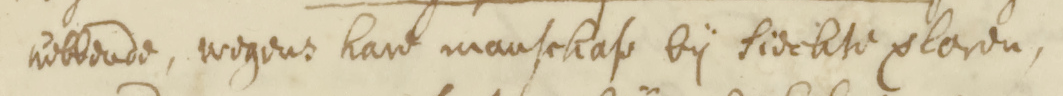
hebbende, wegens hare manschap bij sieckte vloren,
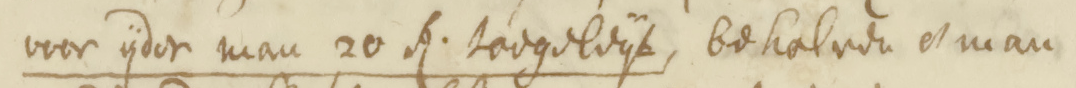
voor ijder man 20 R. toegeleijt, behalven 8 man„
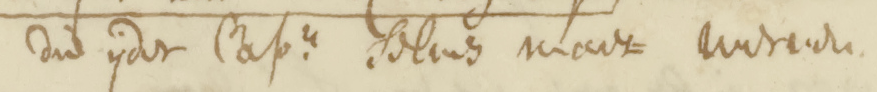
die ijder Capn. selven moet vereren
